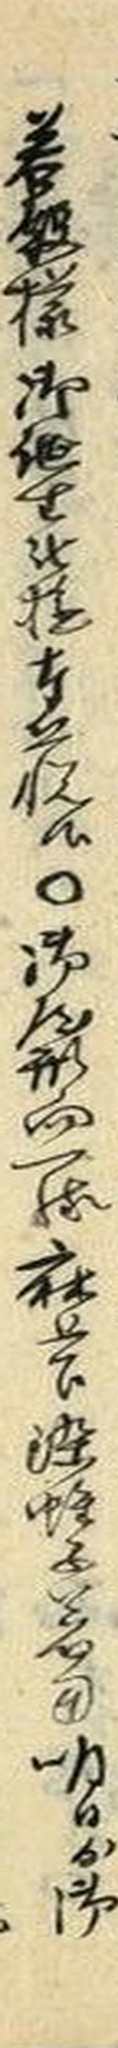若殿様御誕生被遊奉恐悦候○御屋形向一統麻上下染帷子着用明日ゟ御
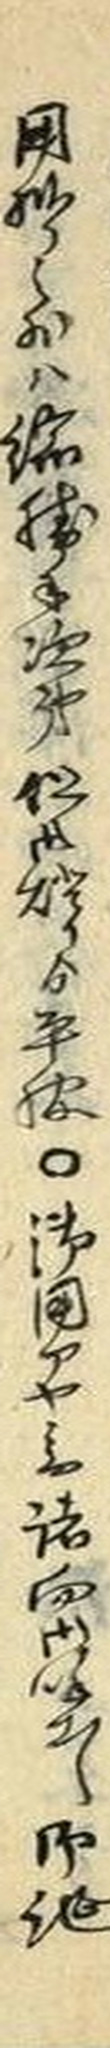用掛り之外ハ縮勝手次第但御燈りゟ平服〇御用部やニ而諸向御呼出し御誕
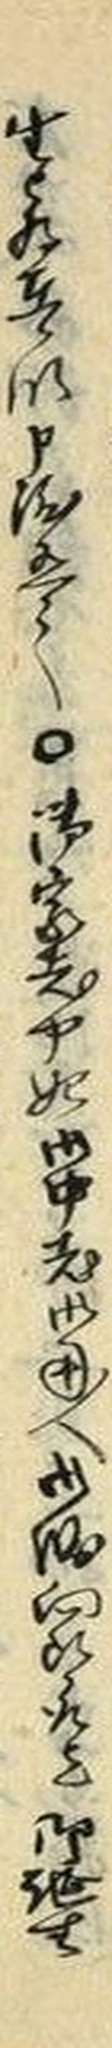生被為在候段申渡有之〇御家老中始御中老御用人御側向頭取迄御誕生
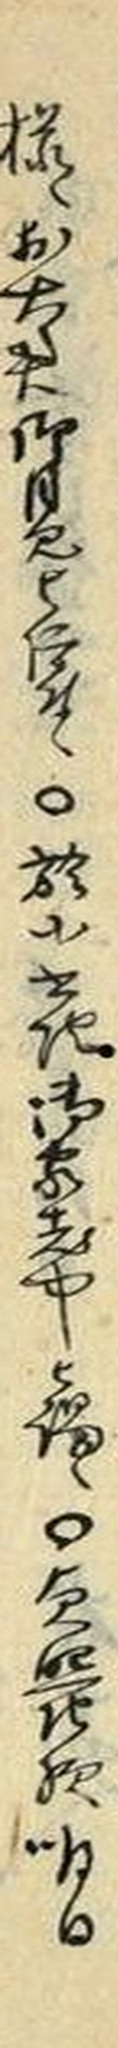様へ於大奥御目見被仰付候〇於小書院御家老中被謁候〇貞照院様明日
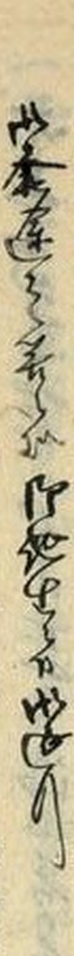御発途之筈候処御誕生ニ付御延引
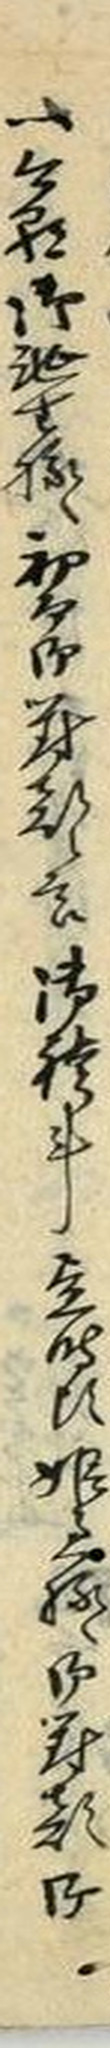一今朝御誕生様へ初而御対顔之節御袴斗昼時頃姫君様へ御対顔御
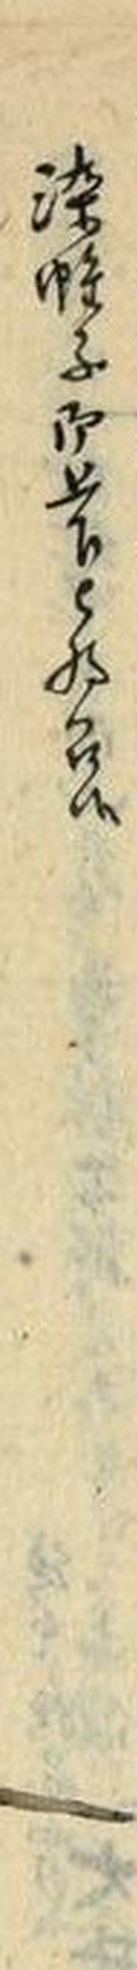染帷子御上下被為召候
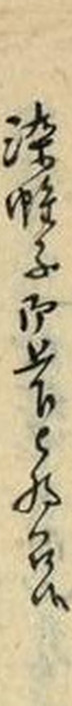染帷子御上下被為召候

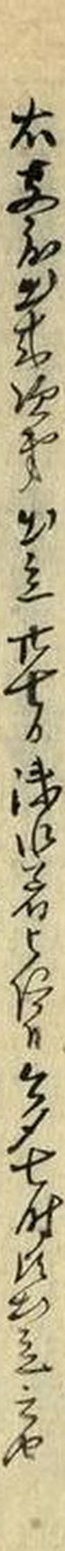右支度出来次第出立廿七日浅水着被仰付今夕七時頃出立之由
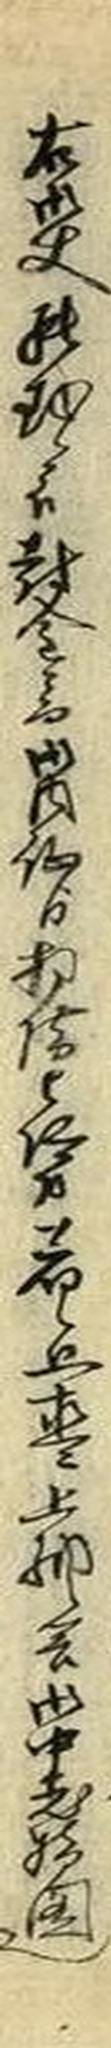右御使罷越候ニ付封金ニ而御内証ゟ拝借被仰付着之上直々上納候筈御中老指図也
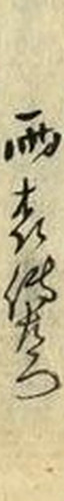同断雨森伝左衛門
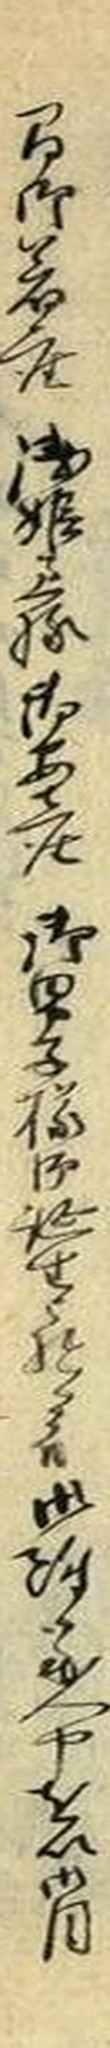間御着座浅姫君様御安産御男子御誕生被遊候ニ付御附御用人中を以御目
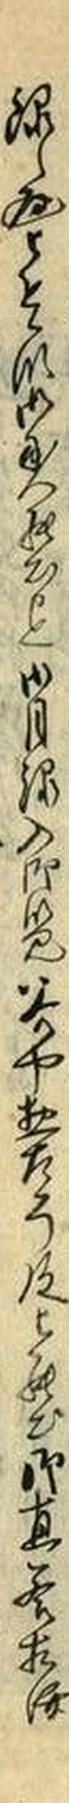録之通被進候段御用人罷出申上御目録入御覧谷中惣左衛門殿被罷出御直答相済
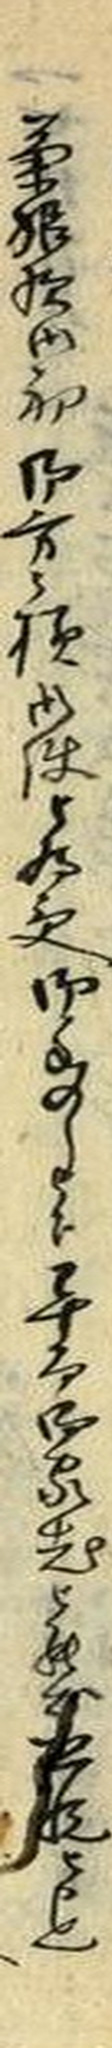菊姫様御初御方々様御使被為受御手のし被下畢而御家老被罷出恐悦被申上
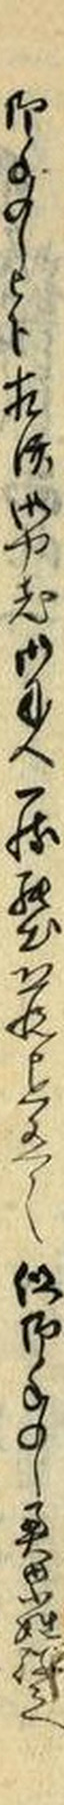御手熨斗被下相済御中老御用人一統罷出恐悦申上有之但御手のし奥御小姓役之
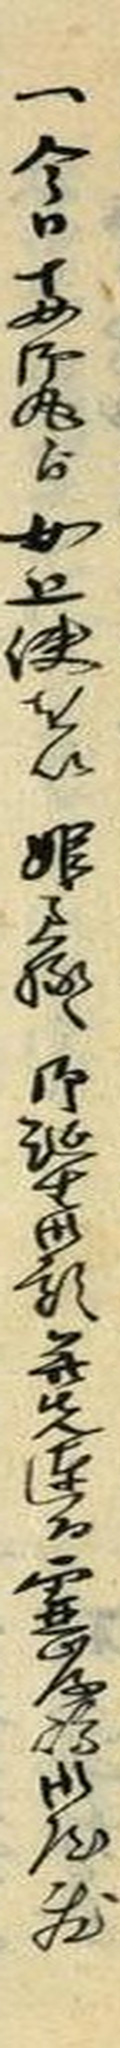一今日両御丸ゟ女上使を以姫君様へ御誕生御歓并先達而霊岸嶋御屋敷
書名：少傅日録抄（斉承付側向頭取日記、在府）
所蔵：福井県文書館 Fukui Prefectural Archives
